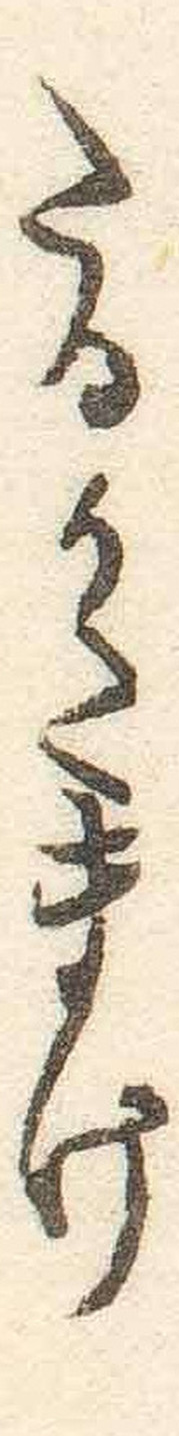たるかたまけ
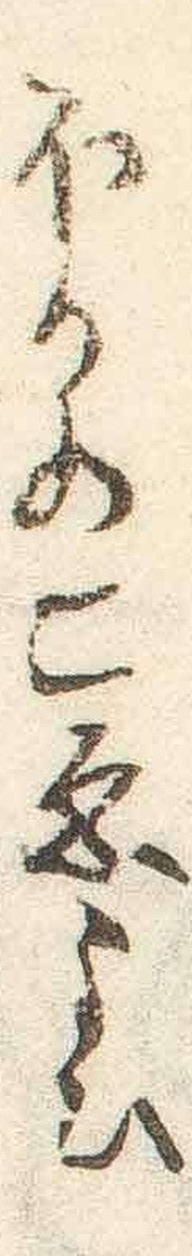ほかのこゑよひ
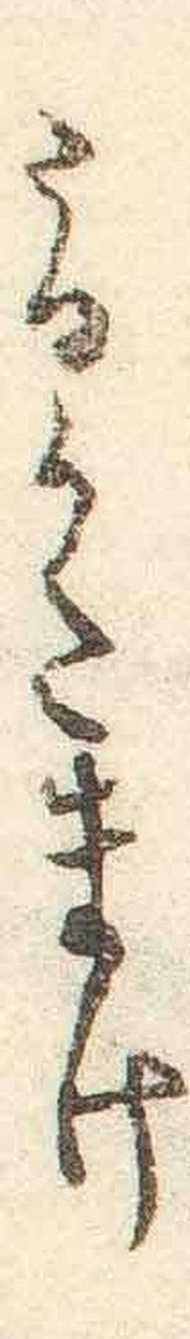たるかたまけ
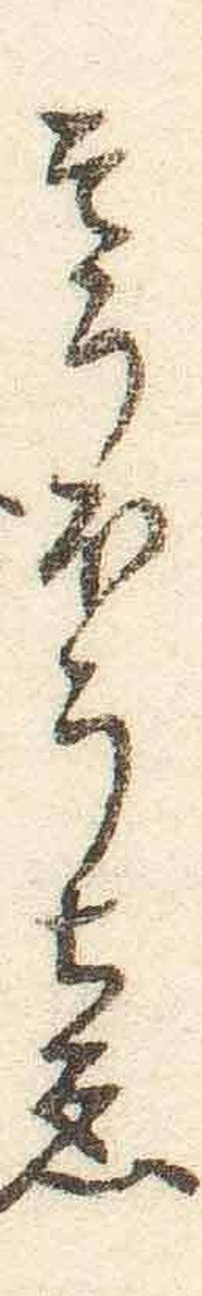そうほうちゑ
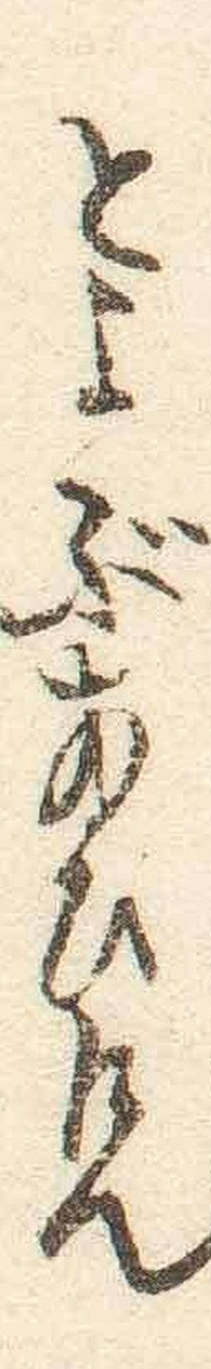とよぶあひけん
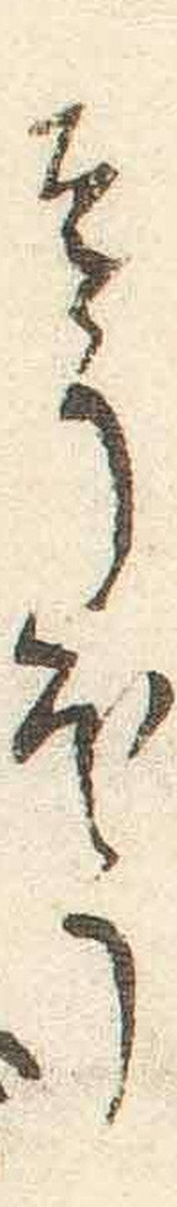そうほう
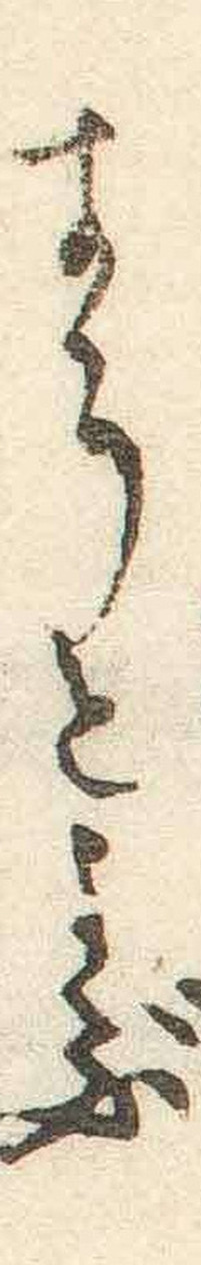すうとよぶ
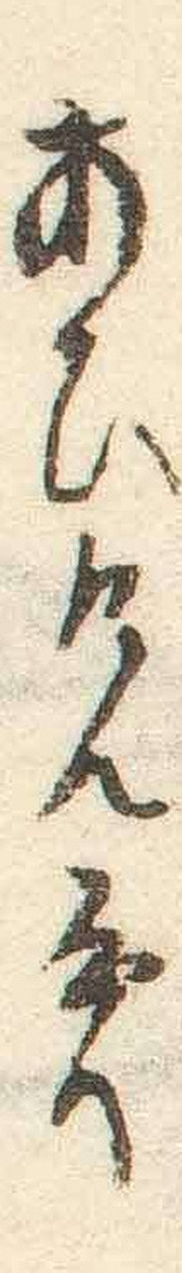あひけんなり

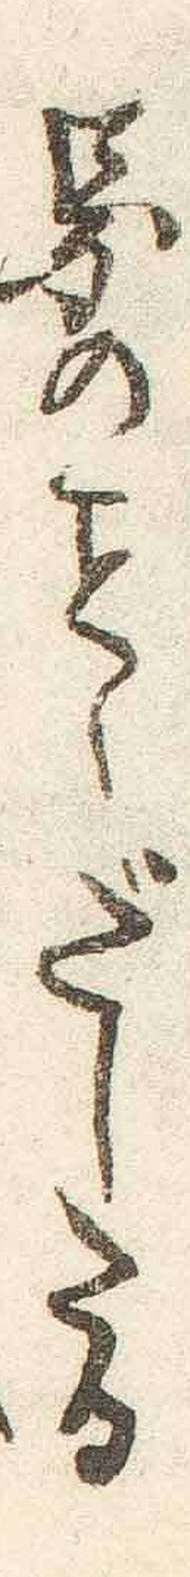図のことくだしたる
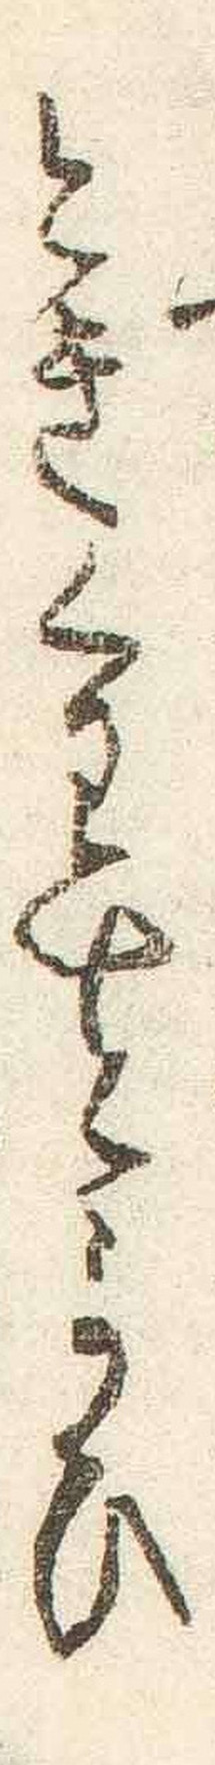ときくわいとよひ
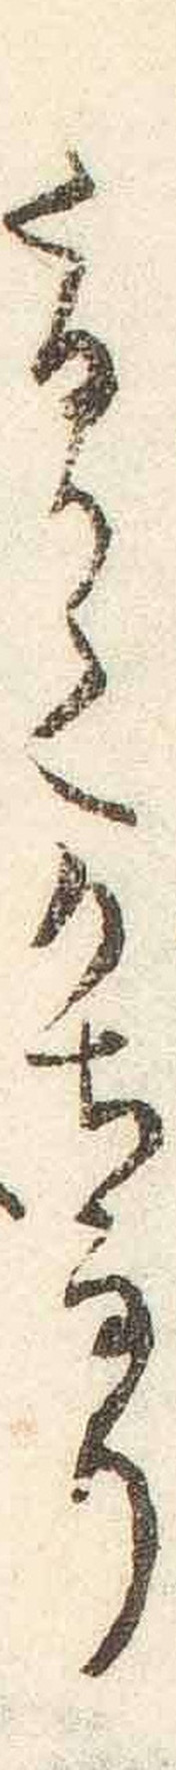たるかたかちなり
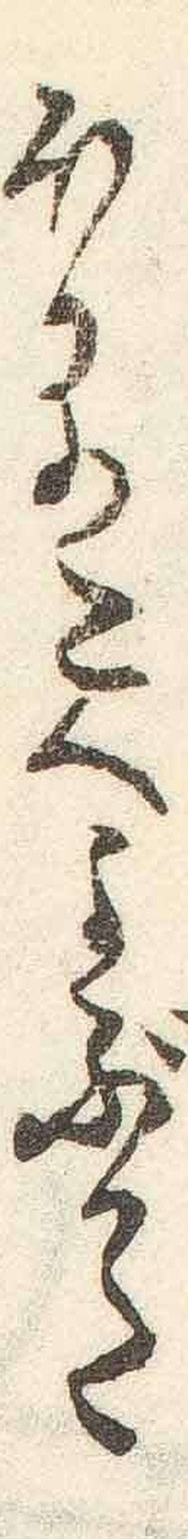ほかのこへよぶかた
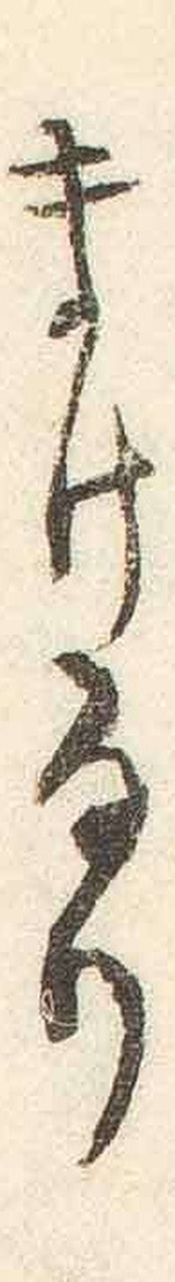まけなり
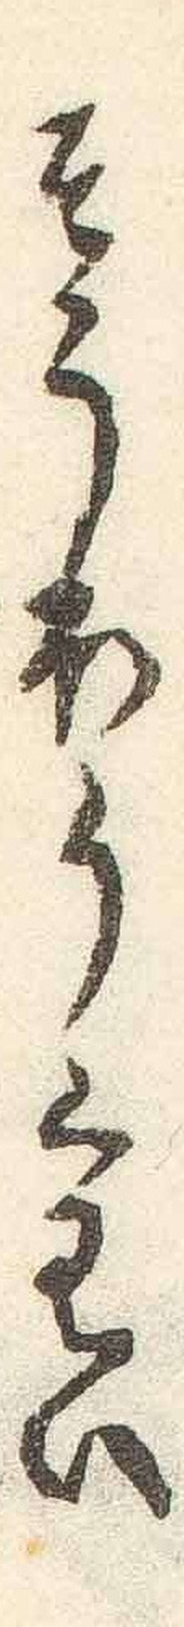そうほうくわい
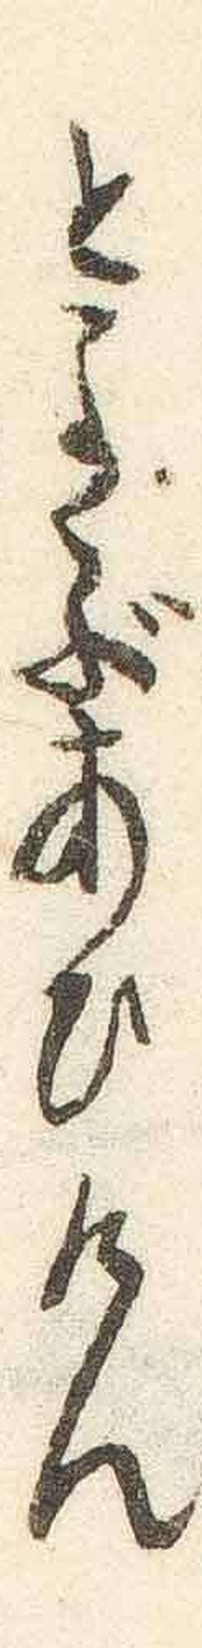とよぶあひけん
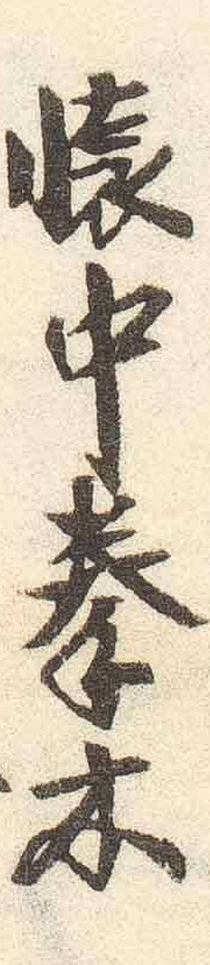懐中拳木
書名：拳独稽古
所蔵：東京学芸大学附属図書館 国文学研究資料館
